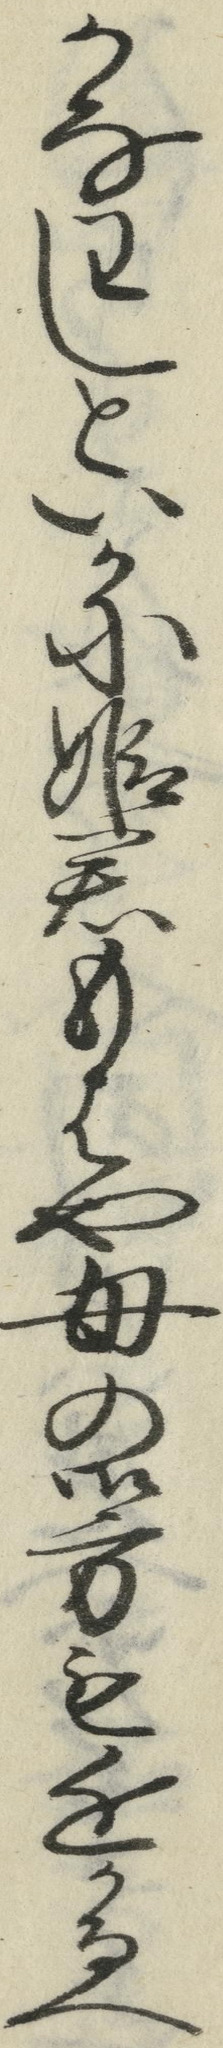かなわしといかに姫君もはや母の御方も近かるへ
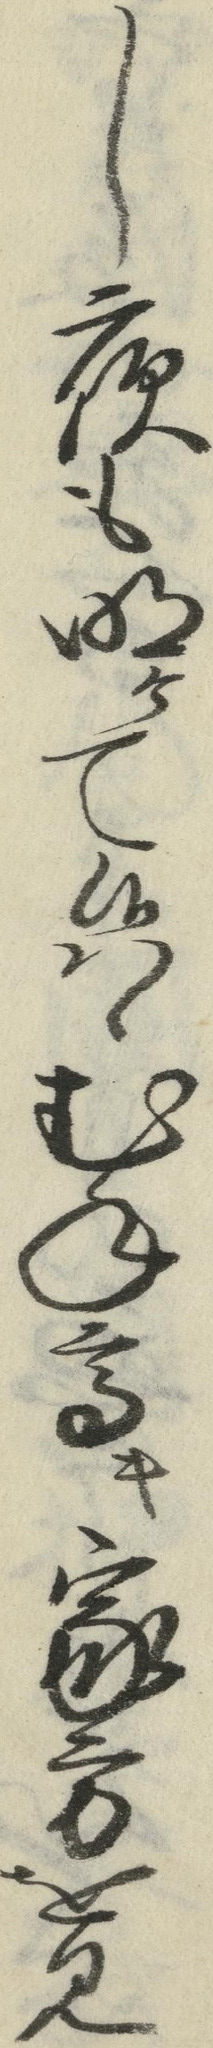し夜も明ケて候ハゝむね高キ家方を見
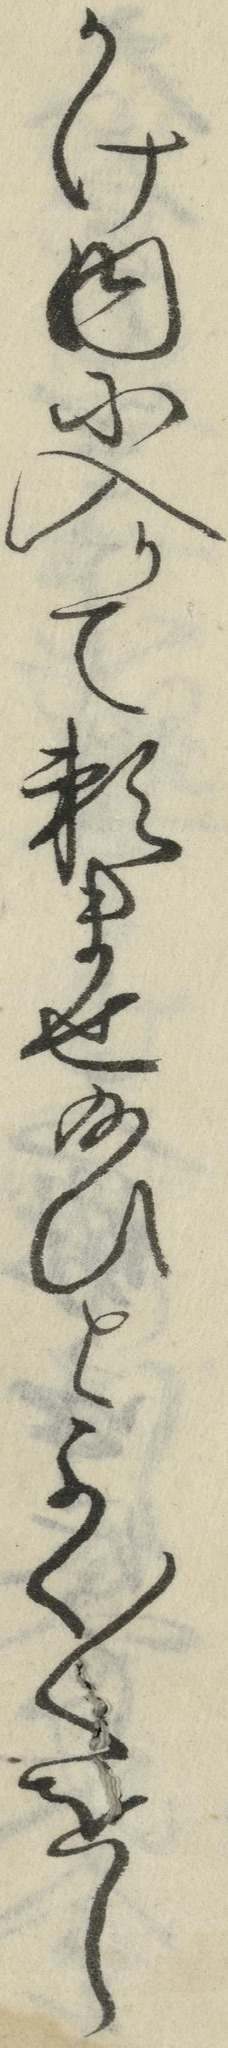かけ内に入りて頼ませ給ひとよく〳〵をし
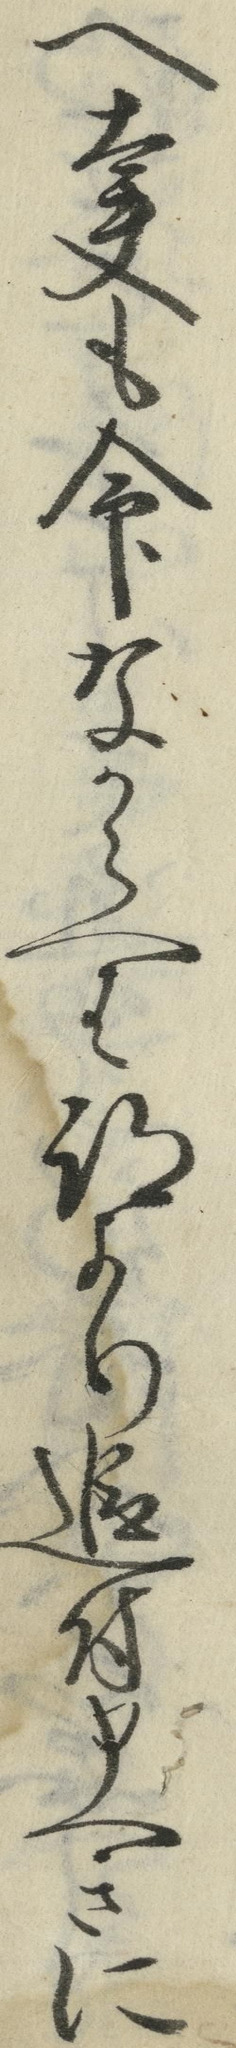へ太夫も命なからへは跡より追付申へきに
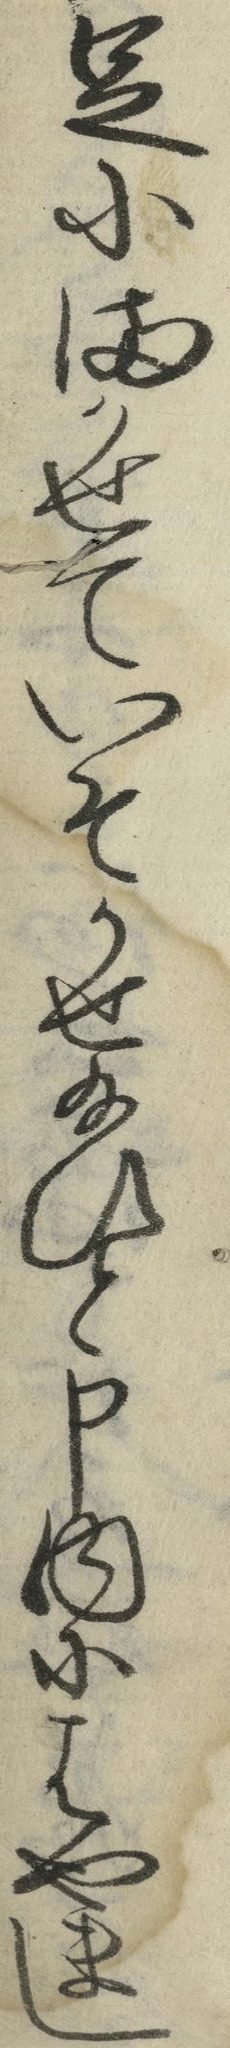足にまかせていそかせ給ひと申内にはやまし

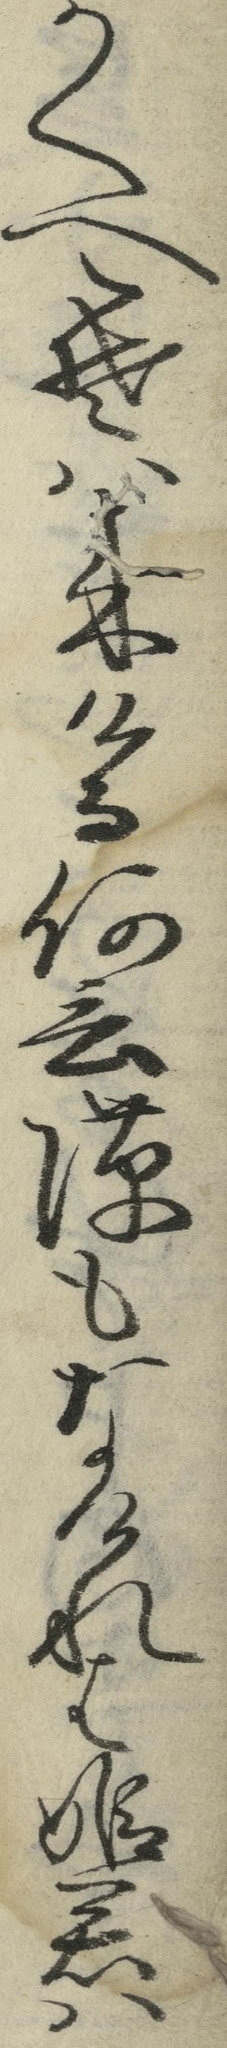かくへこそハ来ける何言隙もなけれは姫君ハ
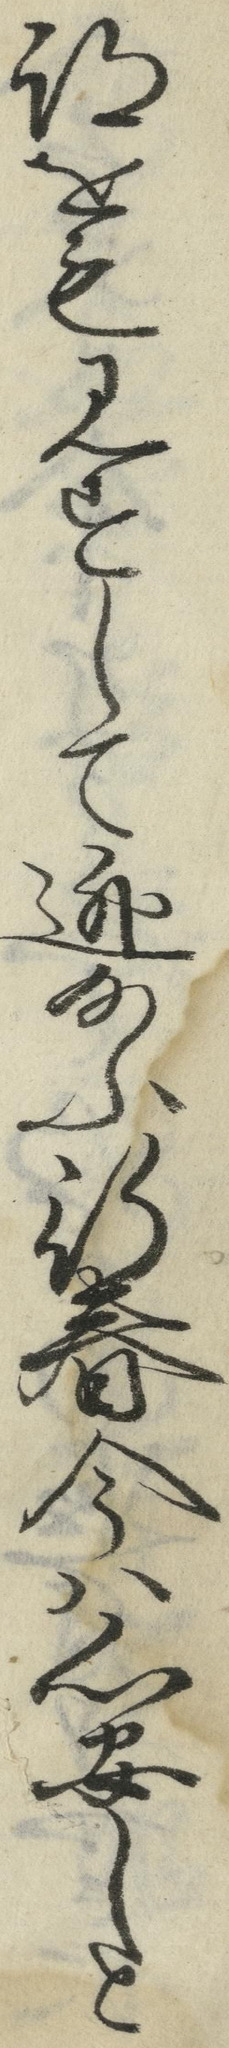跡をも見すして逃給ふ行春今ハ心安しと
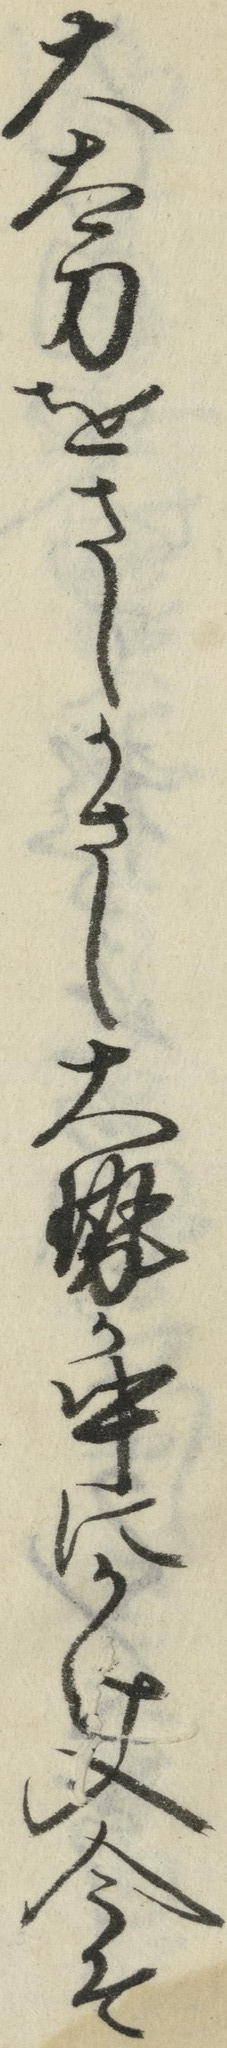大太刀をさしかさし大勢か中にかけ入今そ
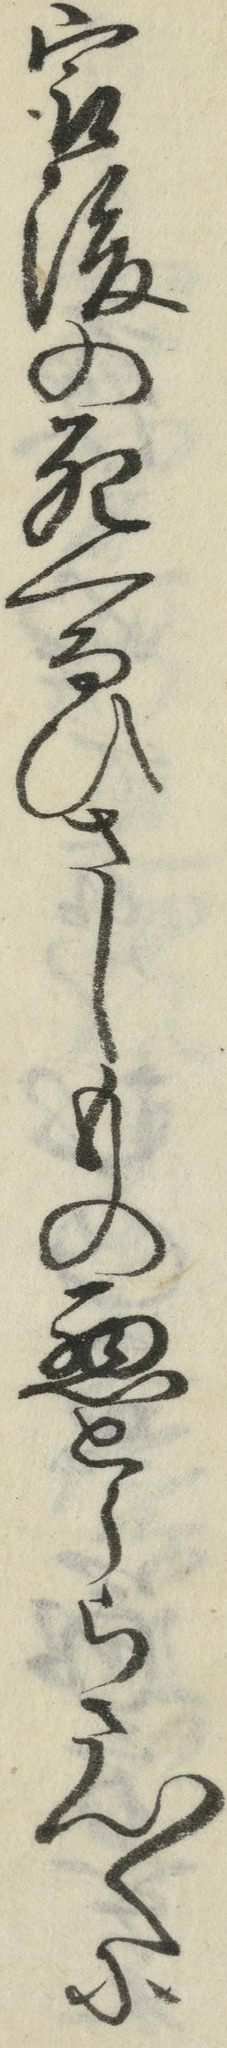最後の死くるひさしもの悪とうらさん〳〵に
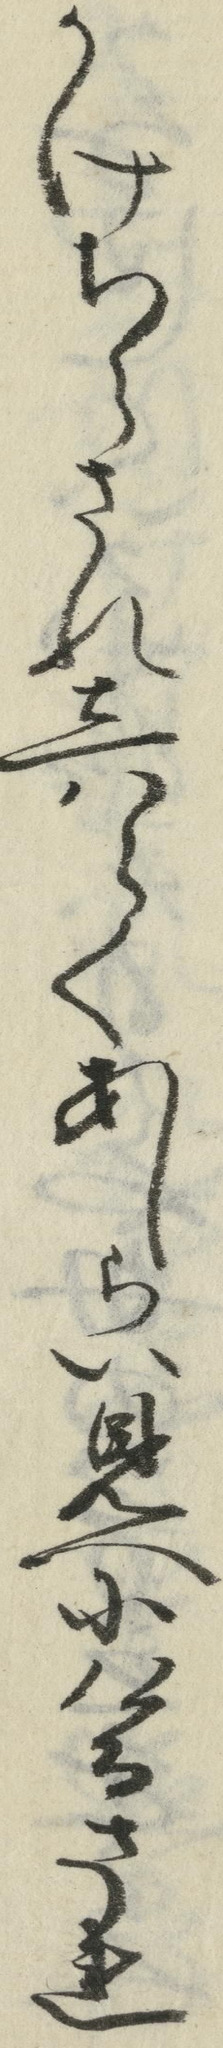かけちらされしハらくあしらい見へにけるされ
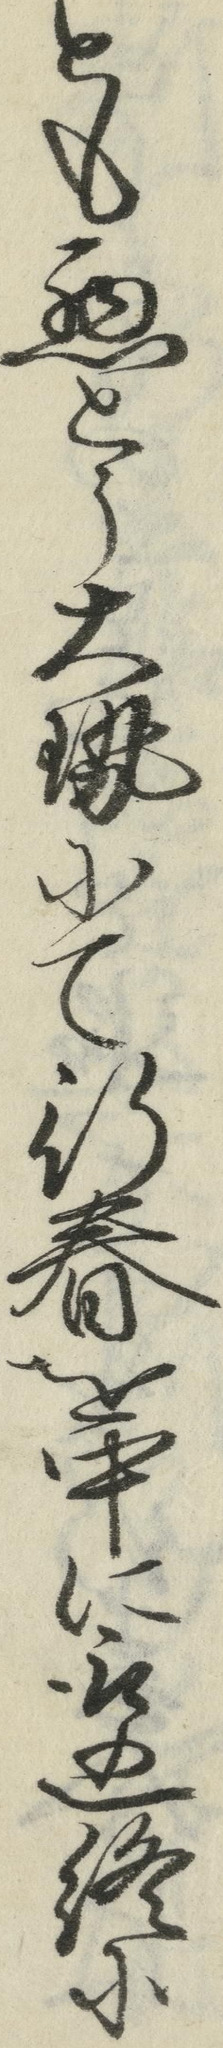とも悪とう大勢にて行春を中に取込終に
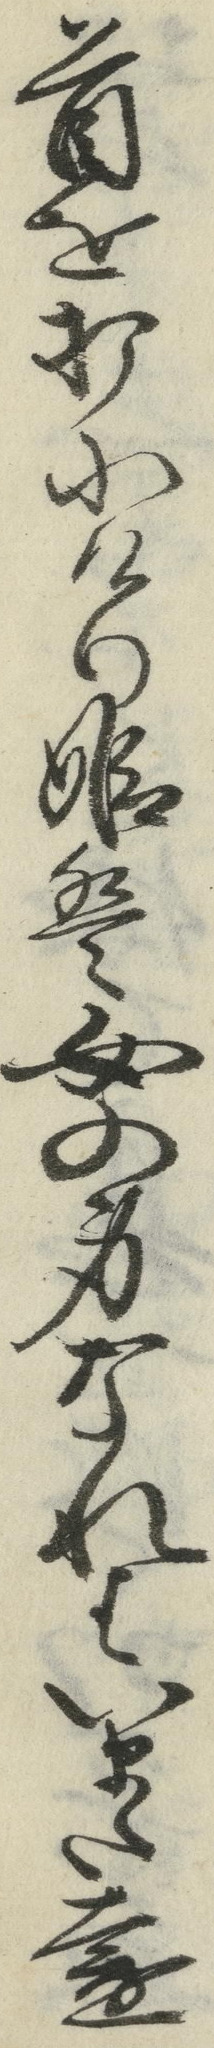首を打にけり姫は女の身なれはいまた遠
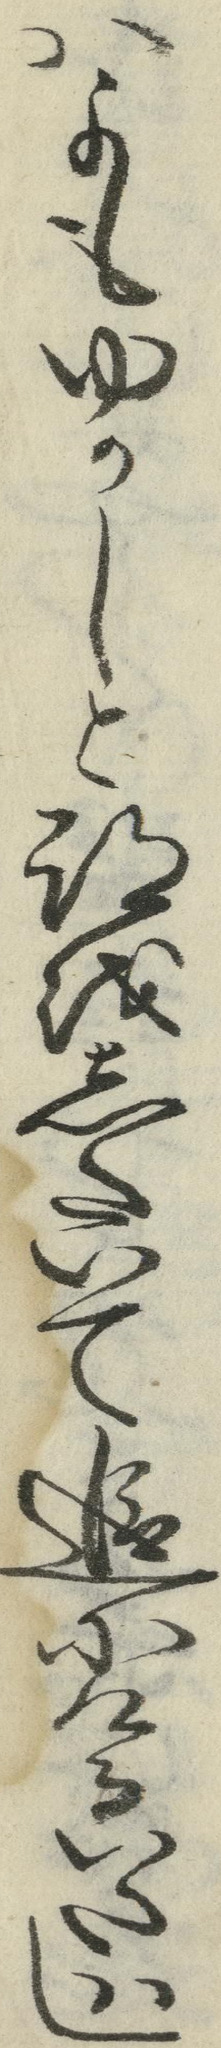ハよもゆかしと跡をしたいて追にけるいたハし
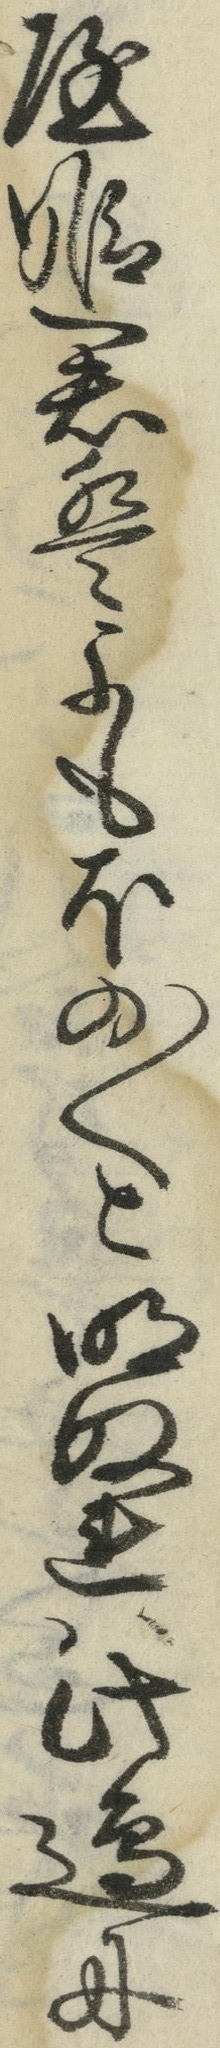や姫君はよもほの〳〵と明ぬれは此辺に
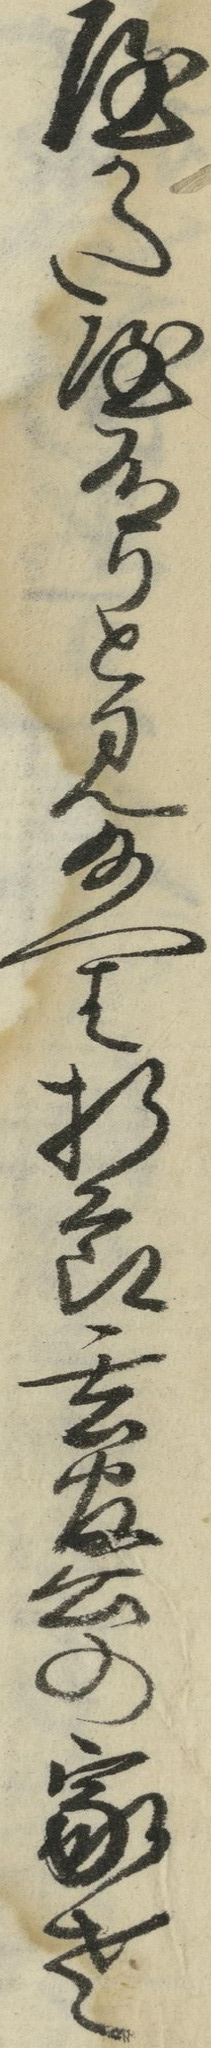屋かた屋有りと見給へは打節玄官公の家老
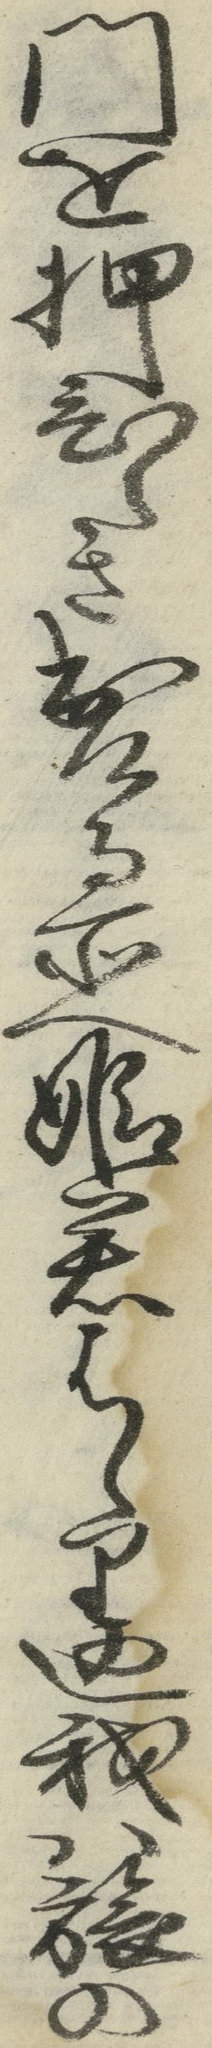門を押ひらき出ける所へ姫君はしり込我ハ旅の
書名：浅間記
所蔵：東京大学地震研究所図書室 Earthquake Research Institute Library, The University of Tokyo, JAPAN
